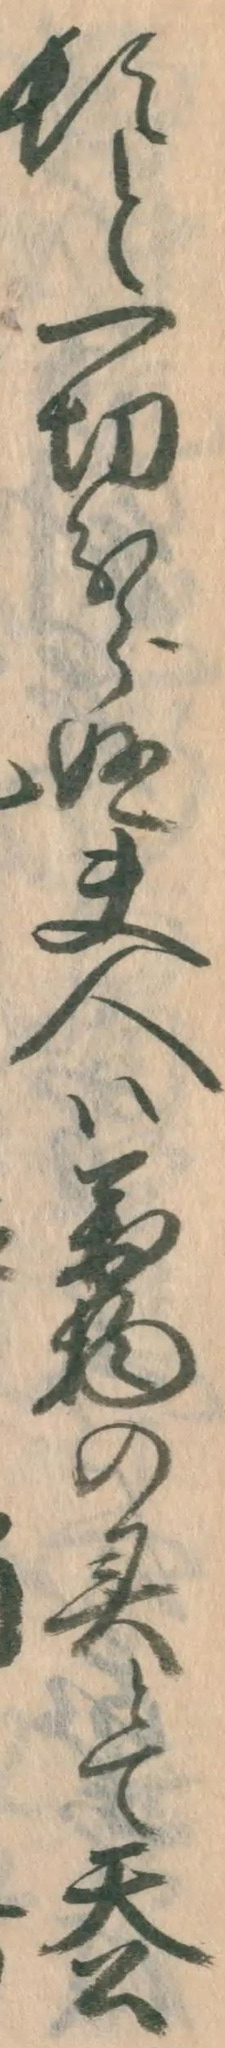頓と一切分らぬ夫人ハ萬物の霊とて天公
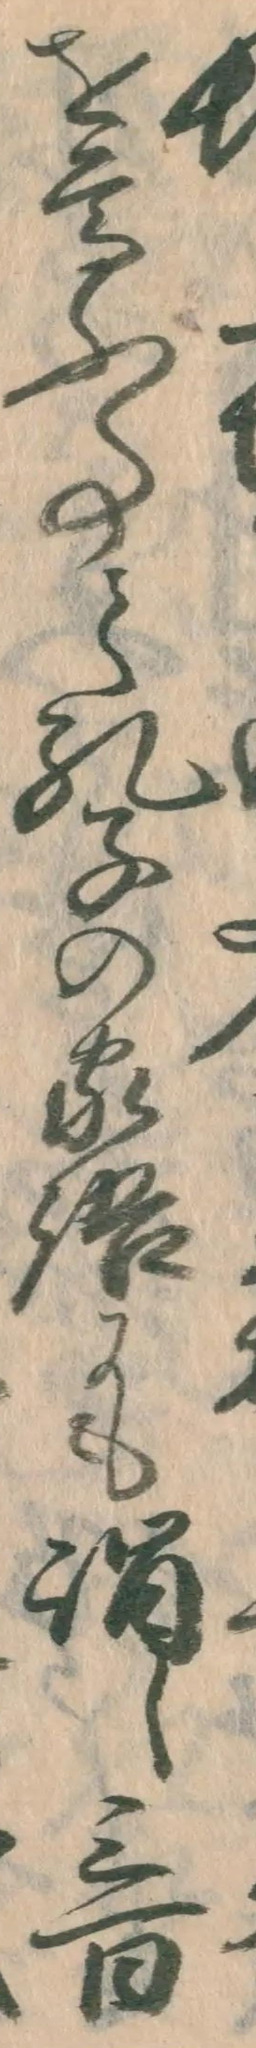を尊ふ事は孔子の家語にも謂し三百
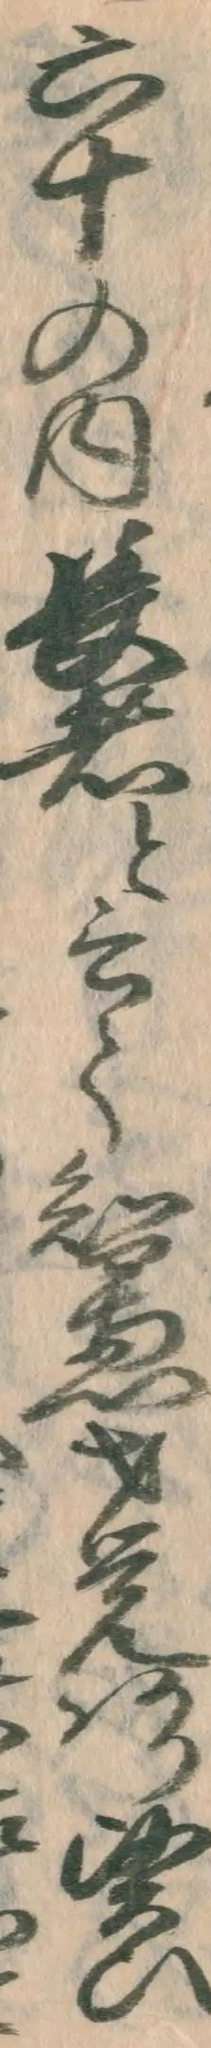六十の内長者と云て智恵才覚あり賢ひ
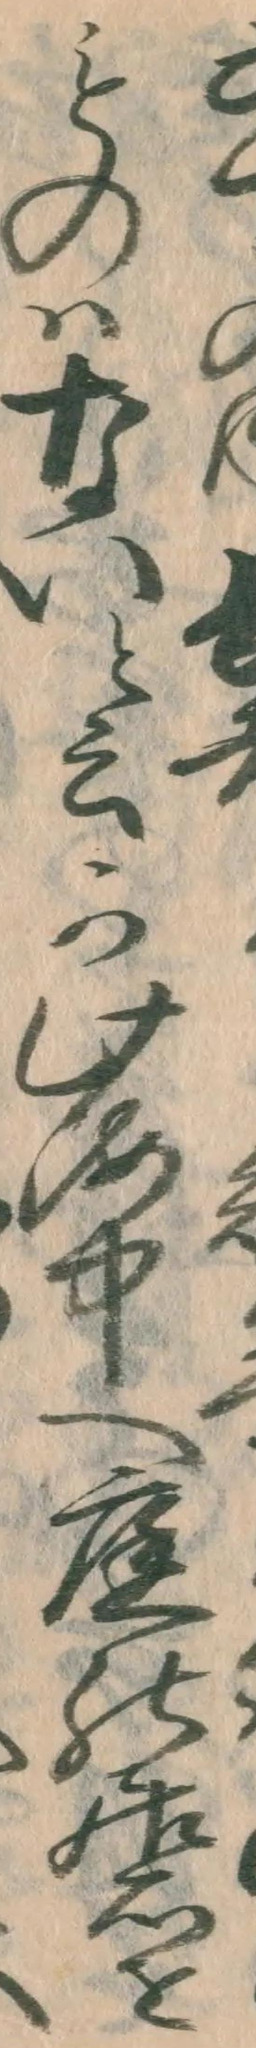ものハないと云か此海中へ庭の居石を
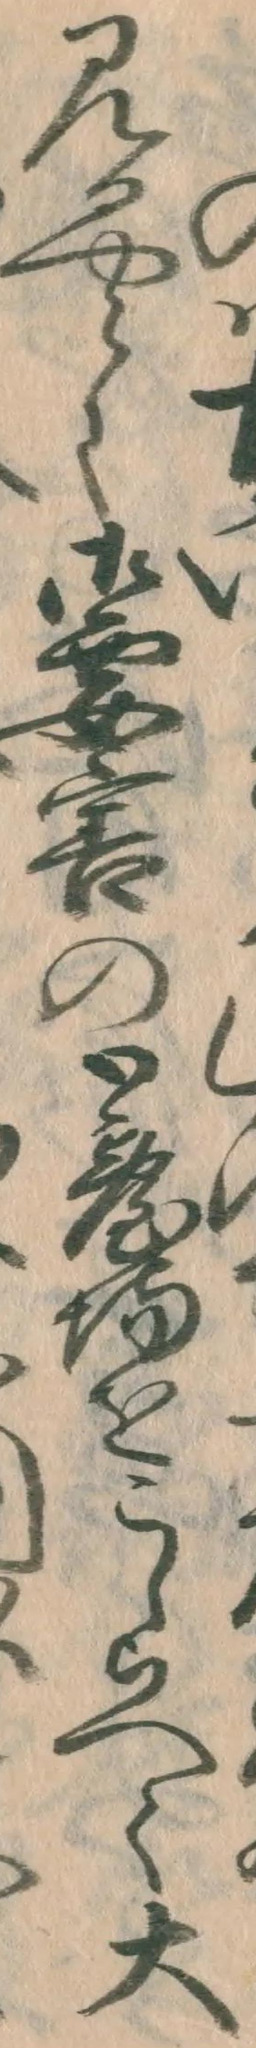見るやうに御要害の御臺場をこしらへて大
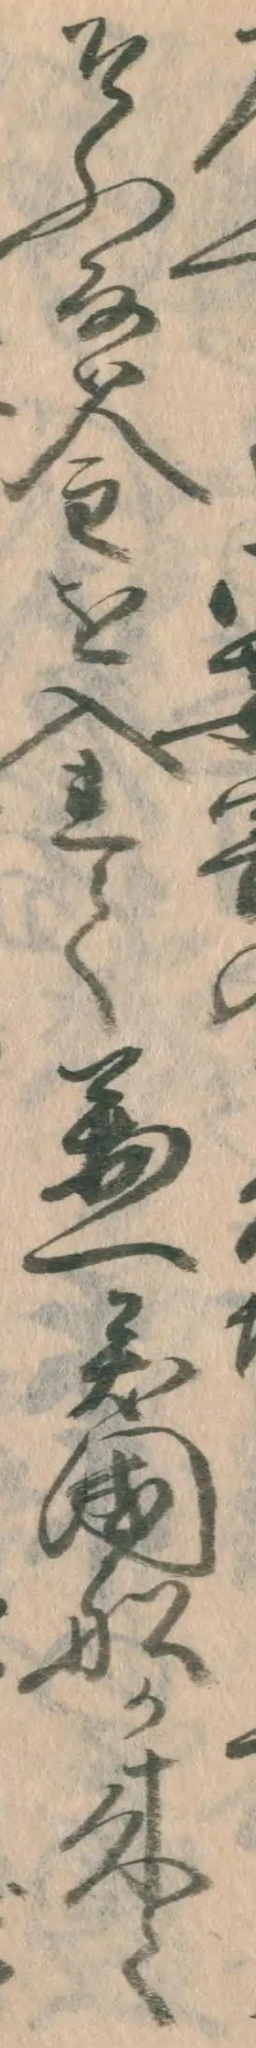そふな御金を入れて萬一異国船か来て
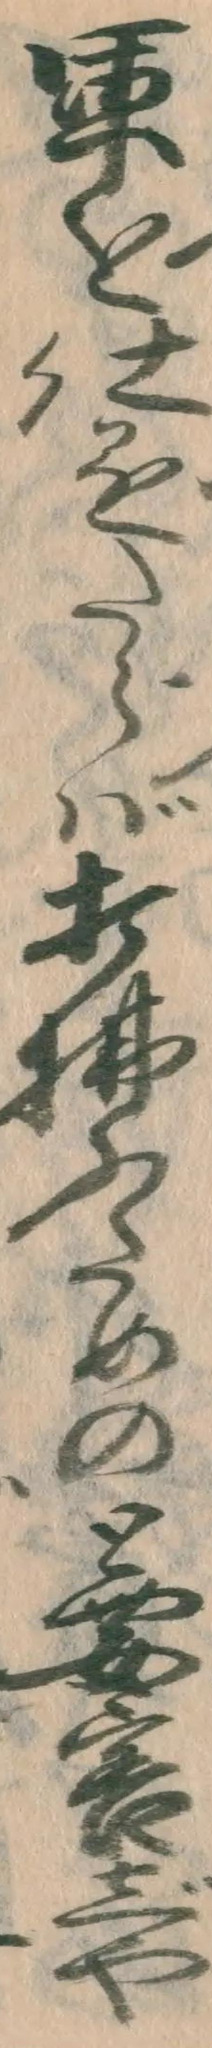軍を仕懸たらバ打拂ふための御要害じや
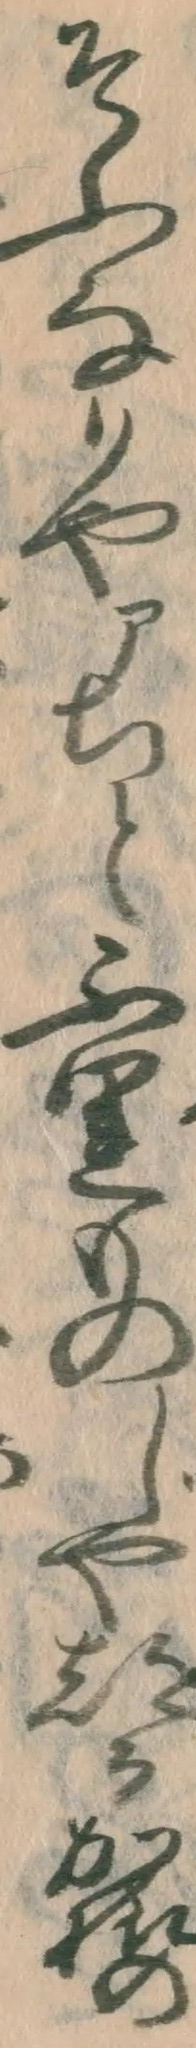そふなりやアちと不運ものじや都而か様の
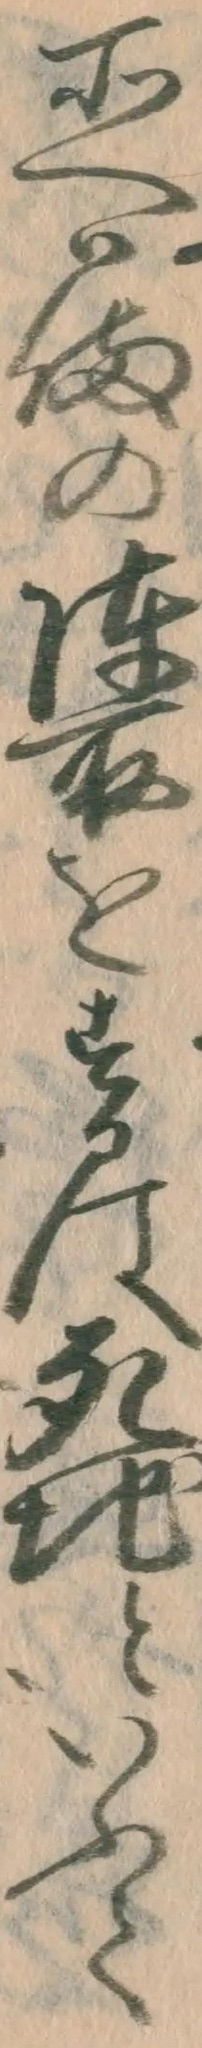所へ御備の陣取をするは死地といふて
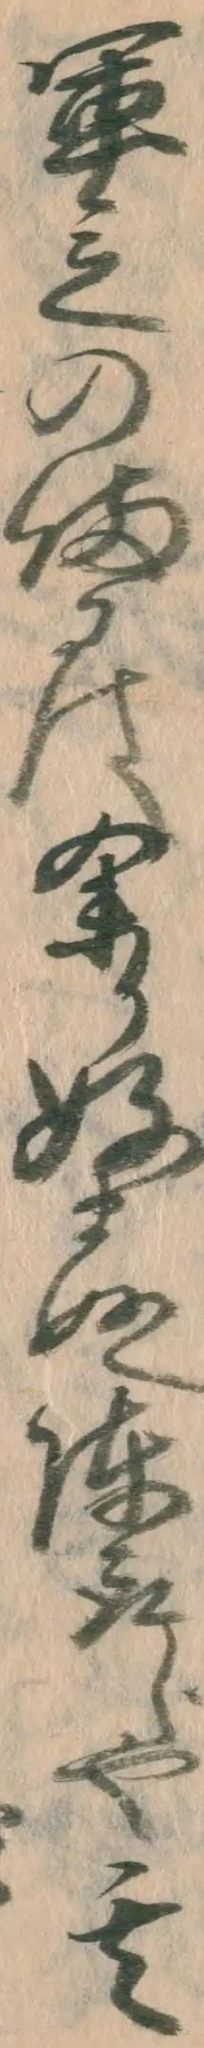軍立の備には余り好まぬ陣取じや其
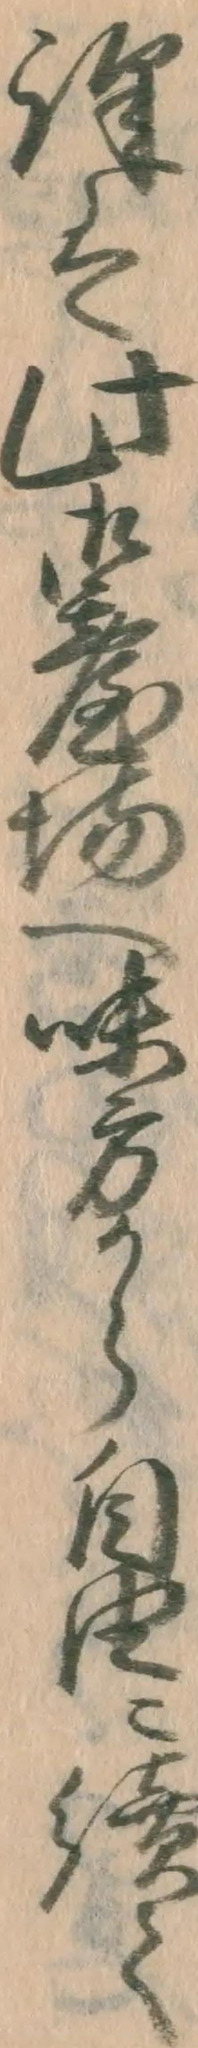譯は此御臺場へ味方から自由二續て
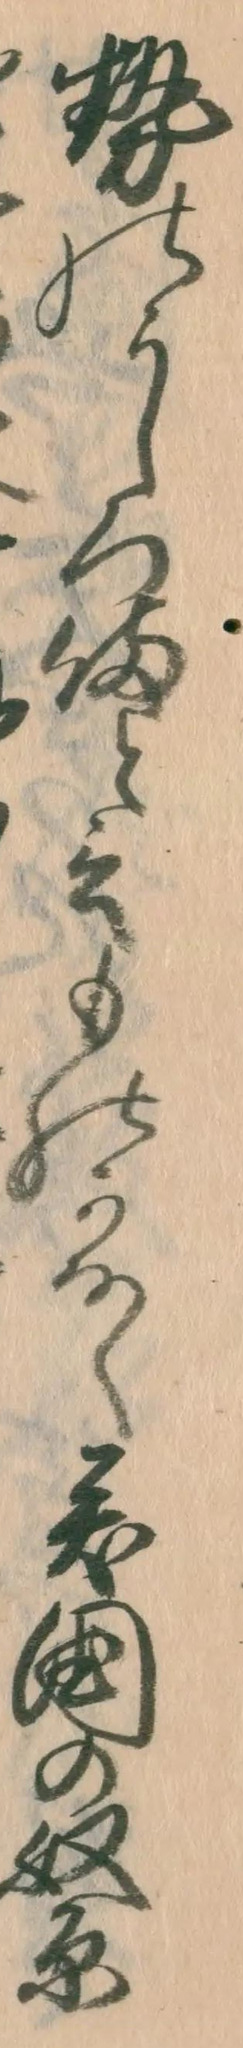勢のうしろ備と云ものかなく異国の奴原
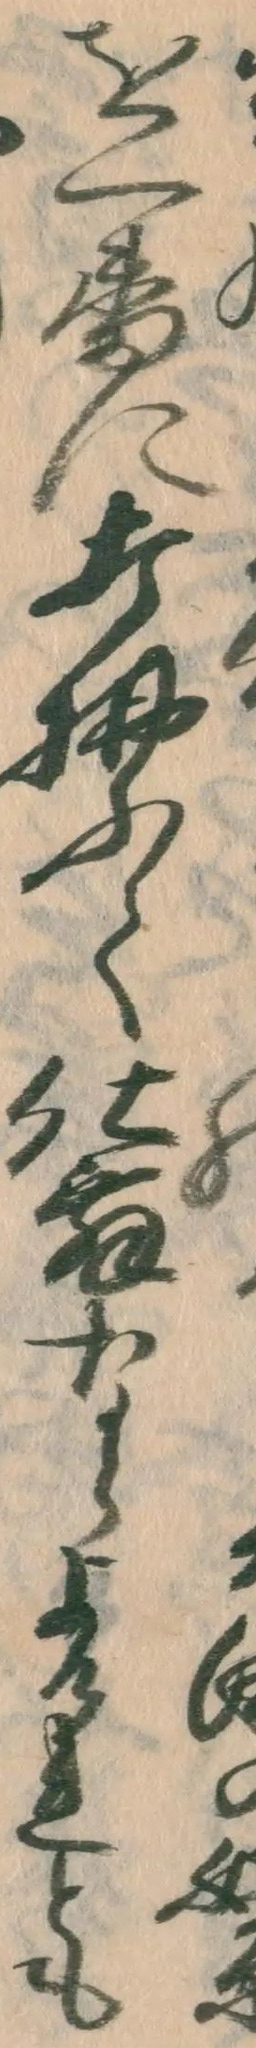を一番に打拂ふて仕舞ならよけれとも
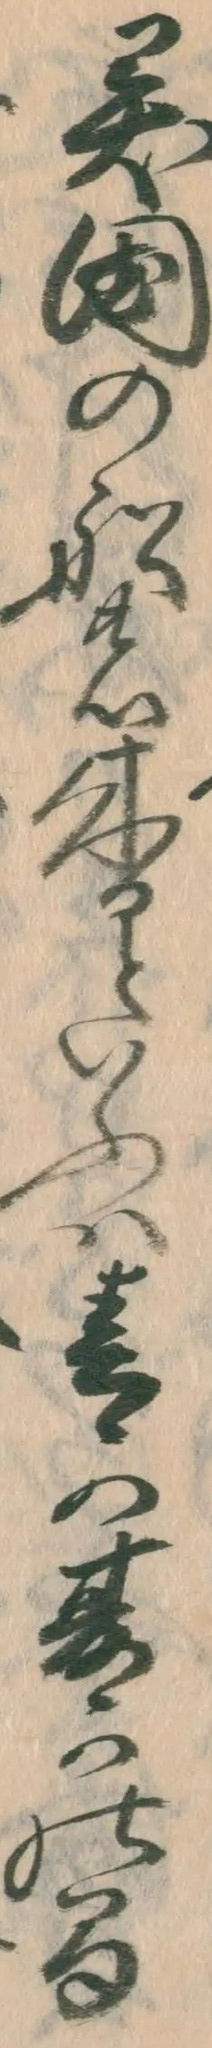異国の船の来るといふハ春か夏かの間
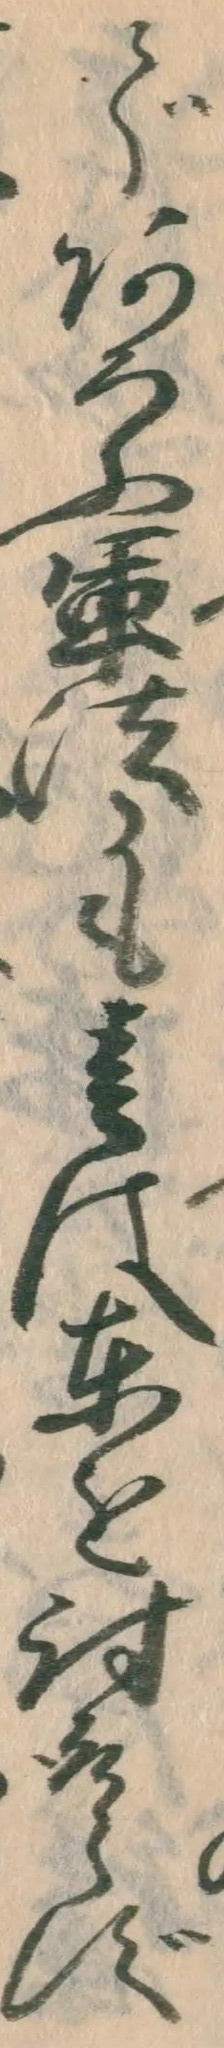であろふ軍法にも春は東を討取らず
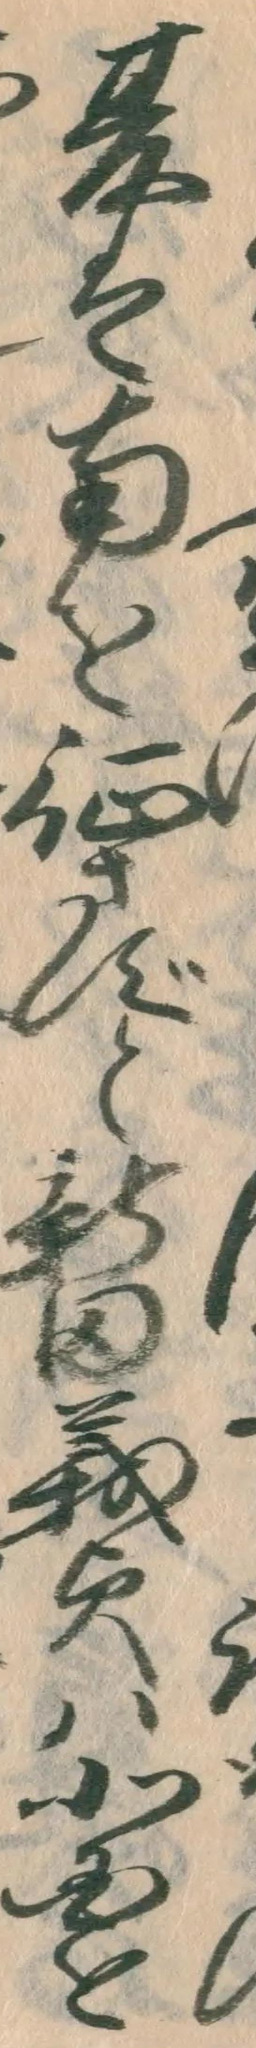夏は南を征さずと新田義貞ハ北国を
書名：麗斎叢書. 20
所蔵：国立国会図書館 National Diet Library, JAPAN
